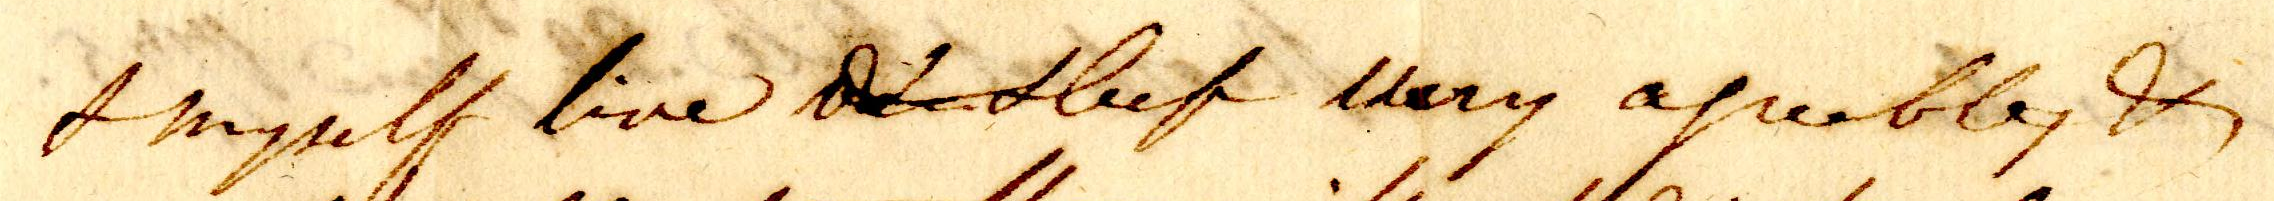& myself live sleep very agreably &
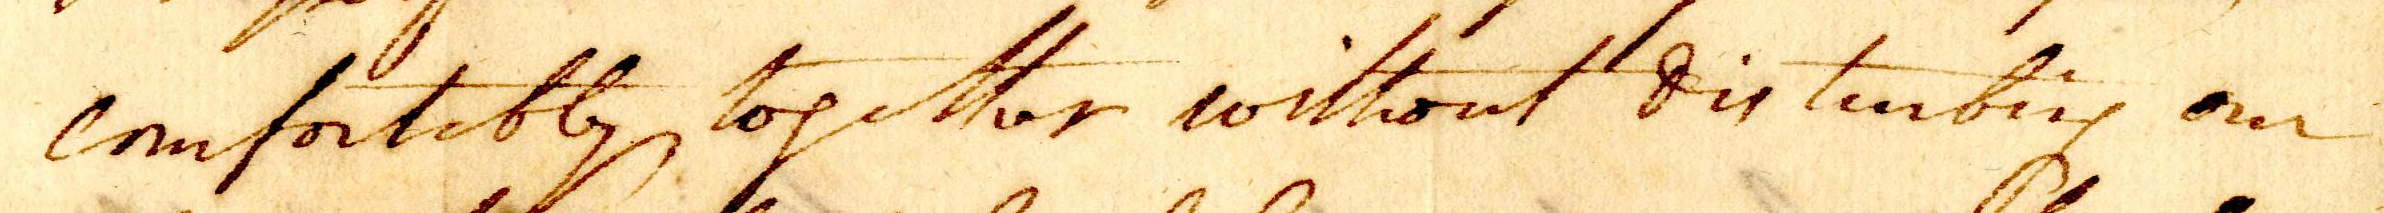comfortably together without disturbing our
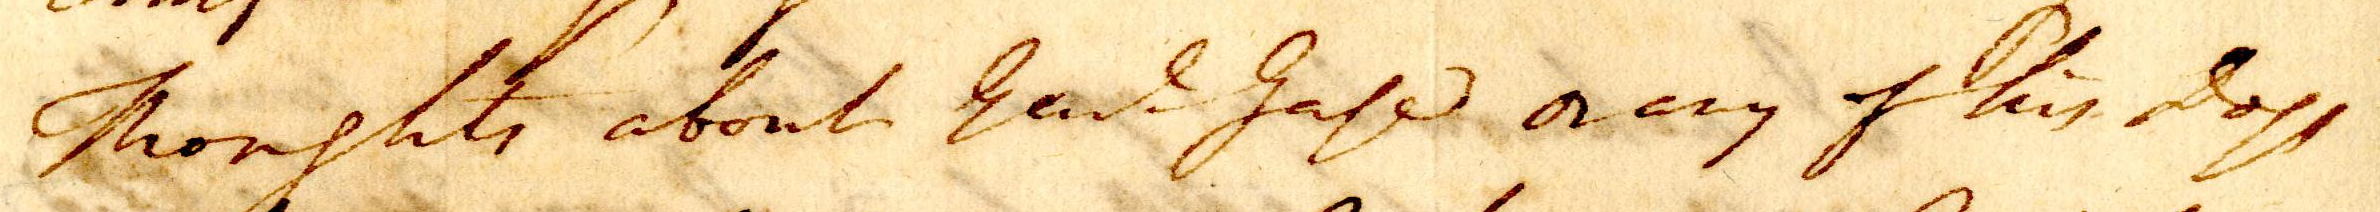Thoughts about Gen^l. Gage or any of his Dogs
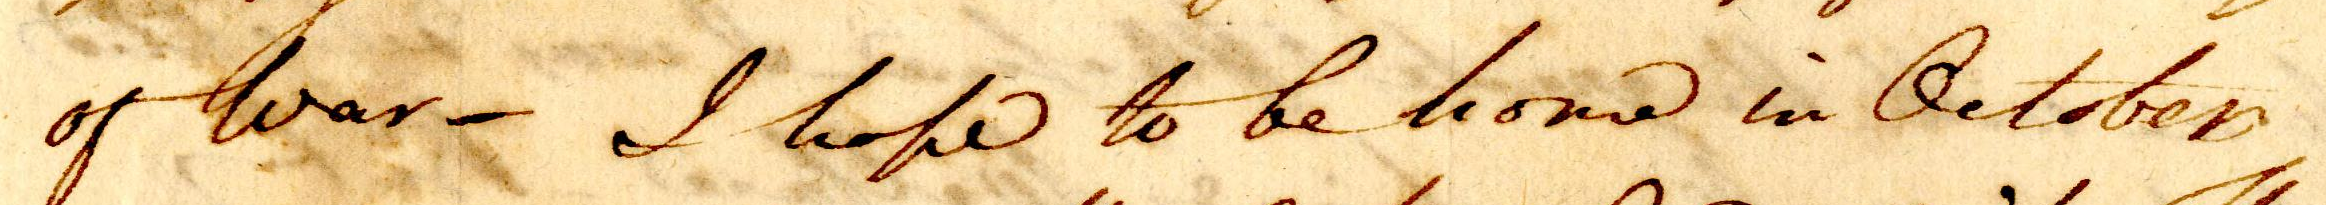of War. I hope to be home in October
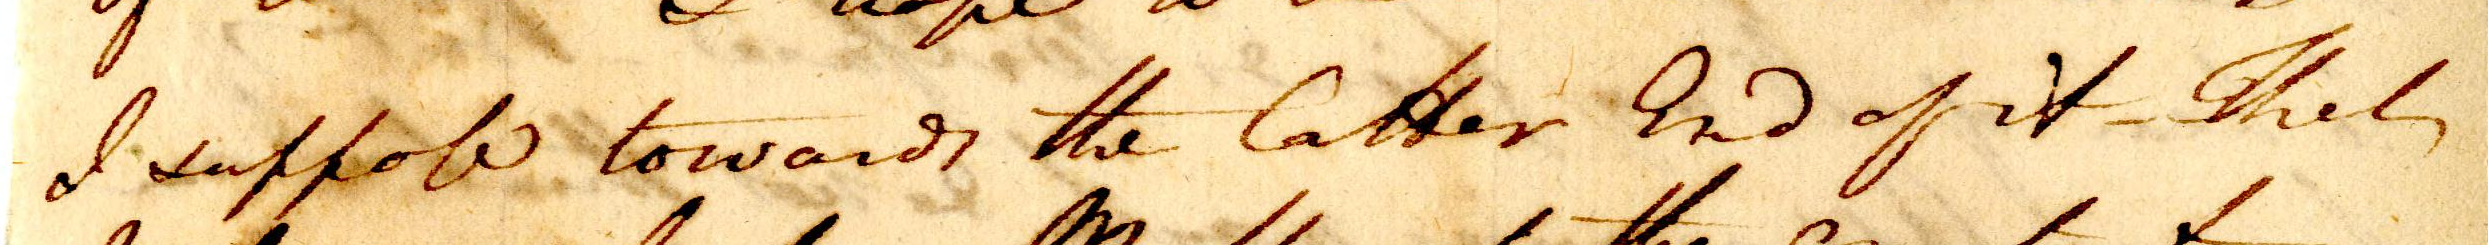I suppose towards the latter End of it. Then
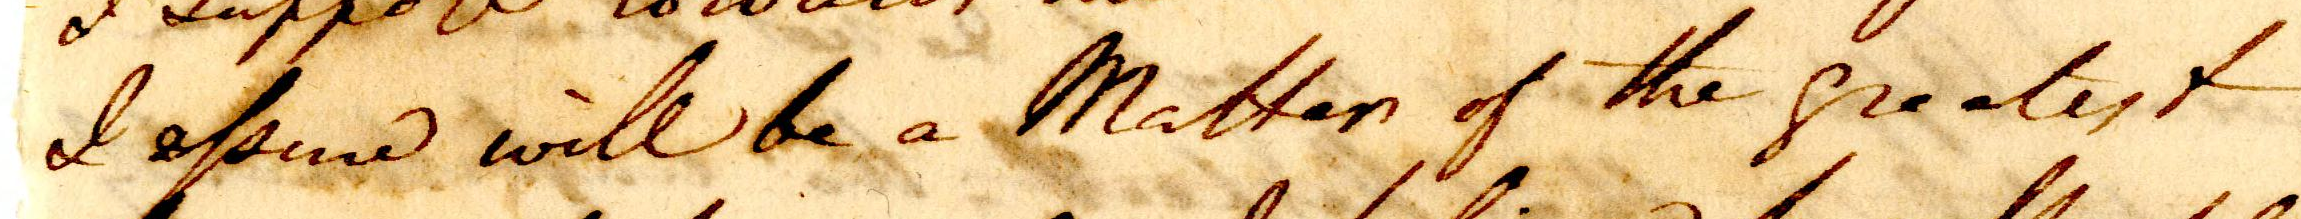I assume will be a Matter of the greatest
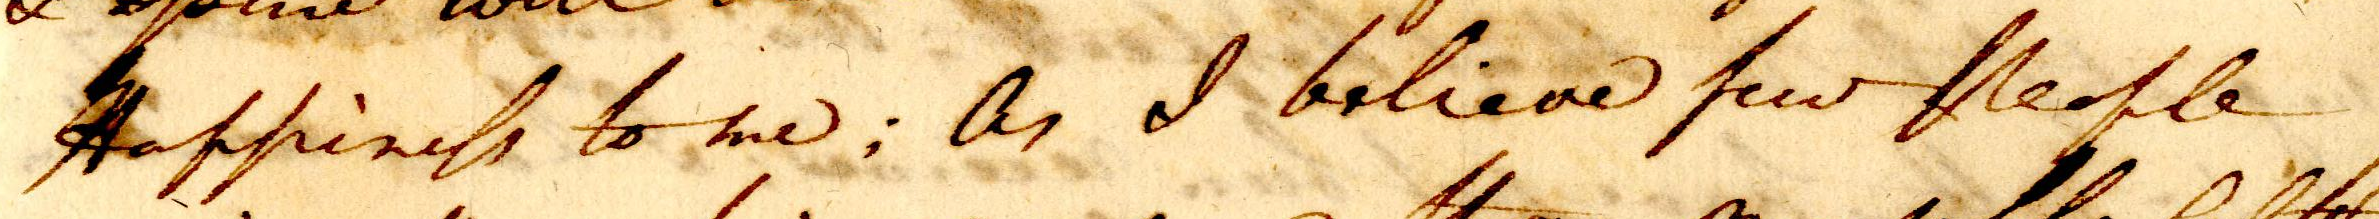Happiness to me: As I believe few People
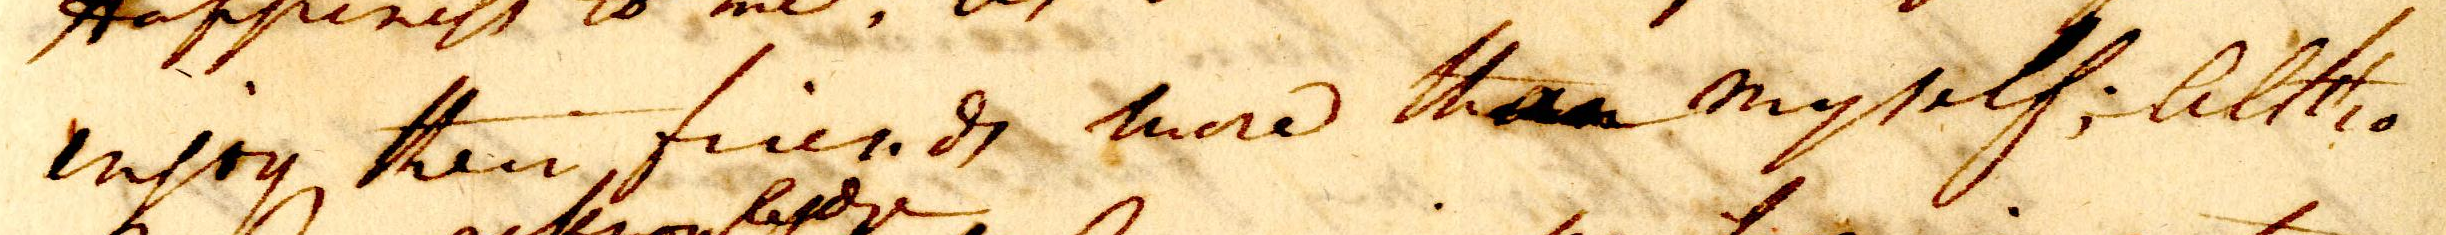enjoy their friends more than myslf: littleso
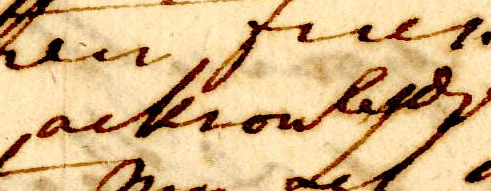acknowledge
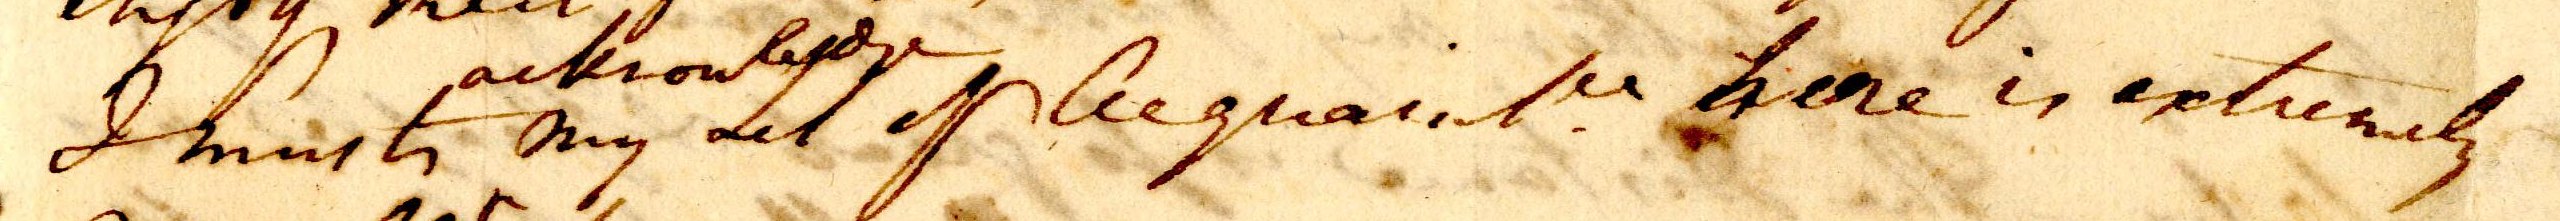I must ^ my Let of Acquaint^ce. here is extremely
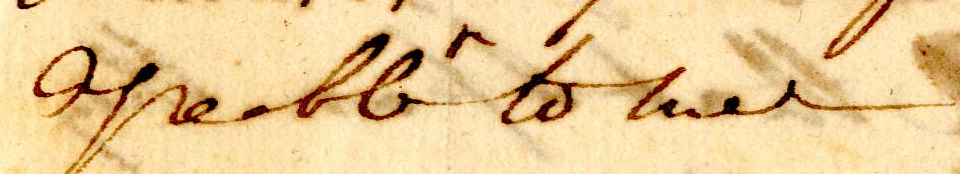agreable to me
